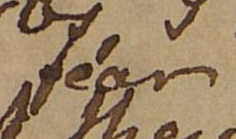fear
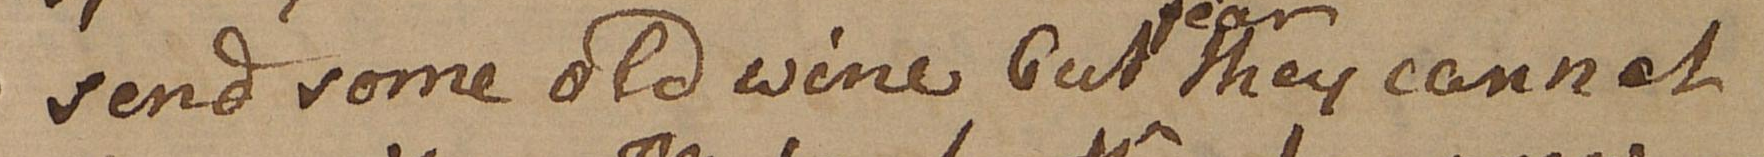send some old wine but ^ they cannot
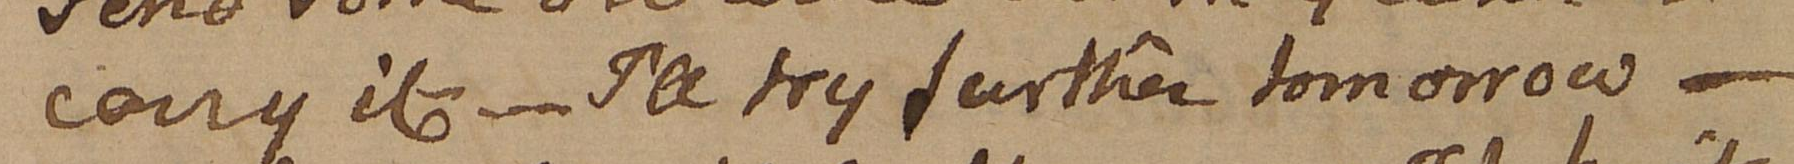carry it- I'll try further Tomorrow-
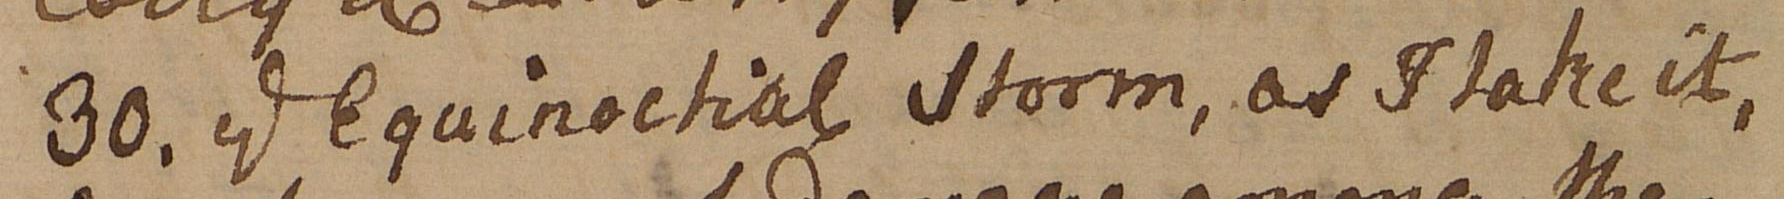30. y^e Equinoctial Storm, as I take it.
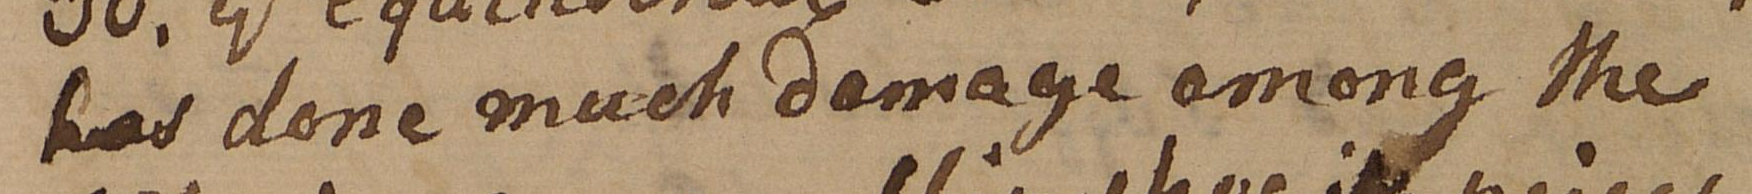has done much damage among the
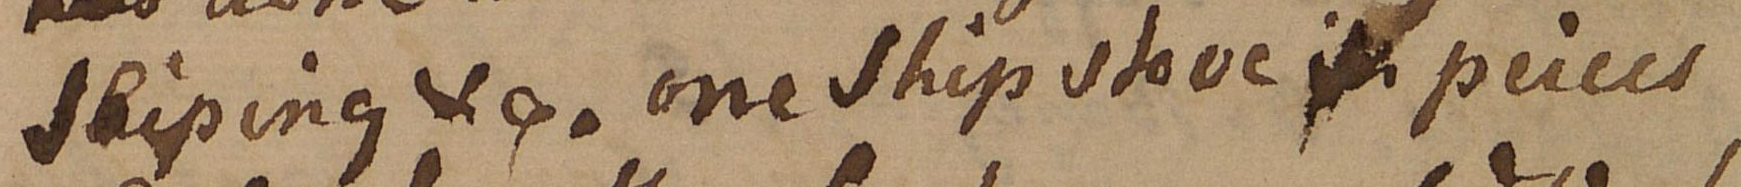Shiping &c. one Ship stove its peices
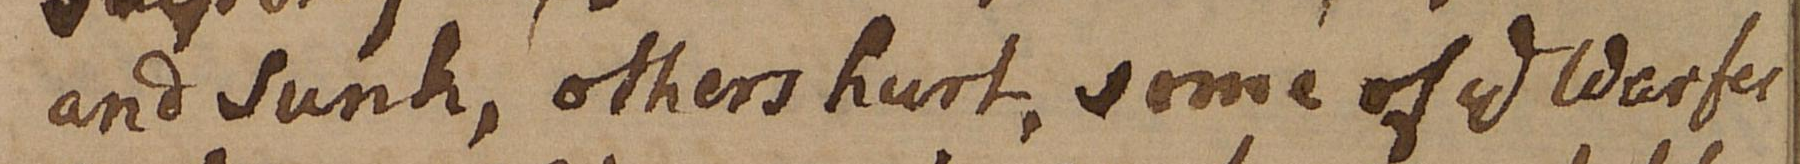and Sunk, others hurt, some of y^e Warfer
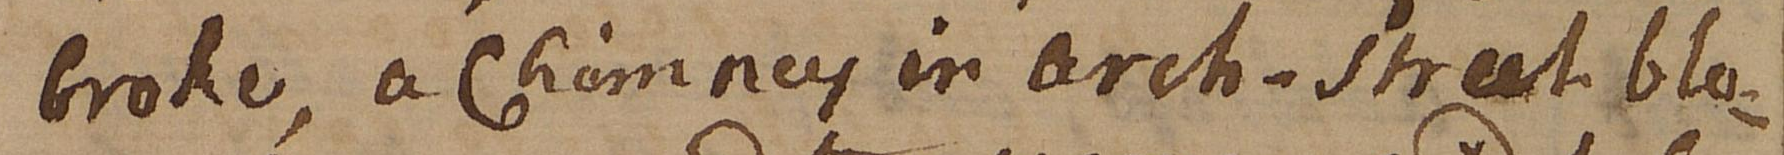broke, a Chimney in arch-street blo-
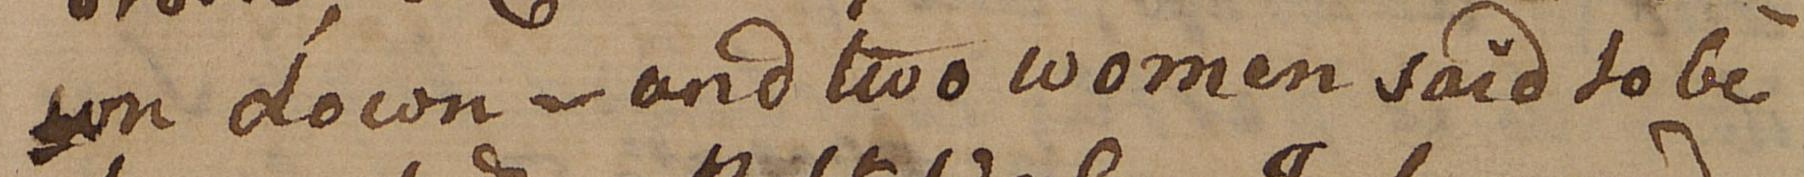wn down- and two women said to be
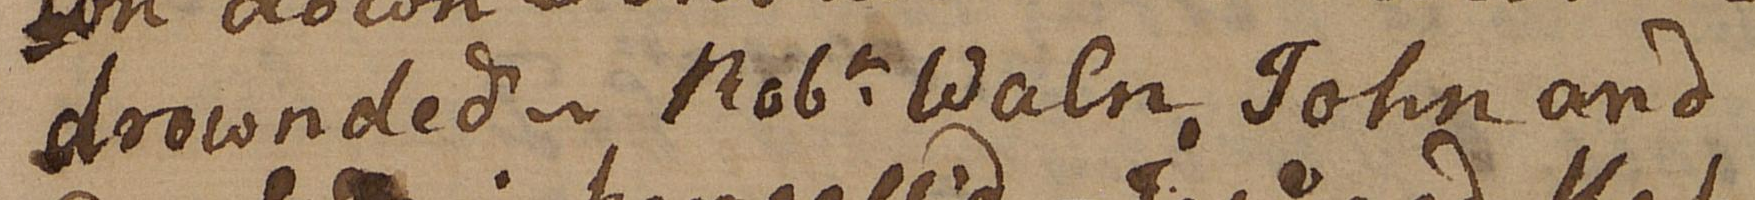drownded- Rob^t. Waln, John and
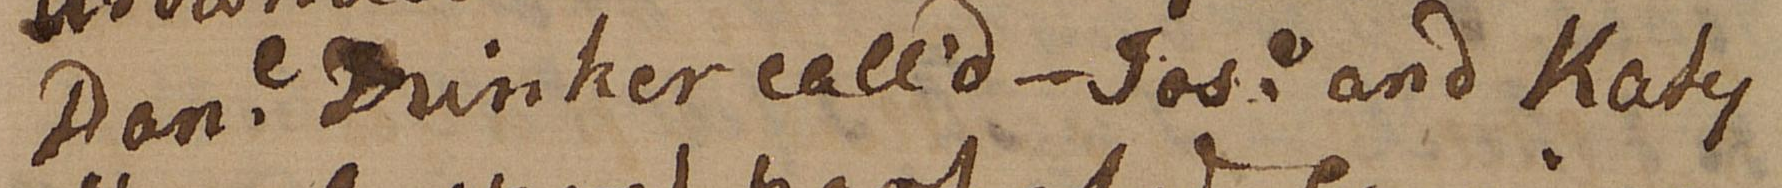Dan^l. Drinker call'd- Jos^a. and Katy
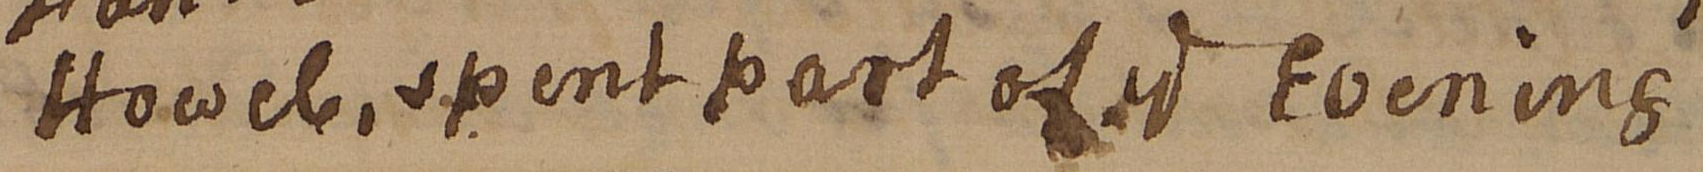Howel, spent part of y^e Evening
